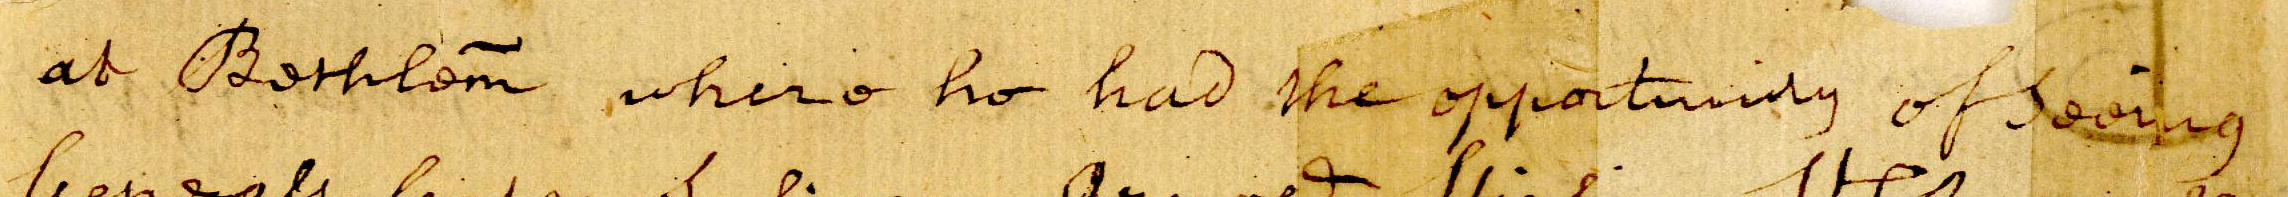at Bethlem where he had the opportunity of seeing
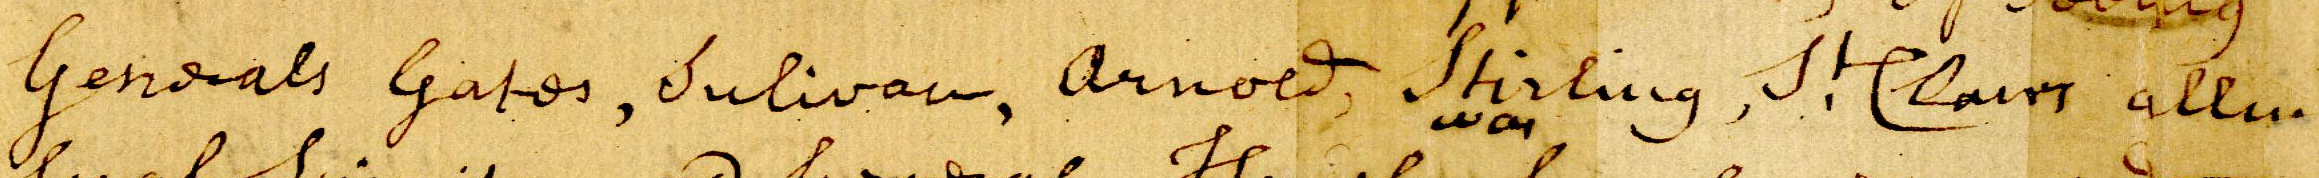Generals Gates, Sulivan, Arnold Stirling, S^t. Clairs allu-
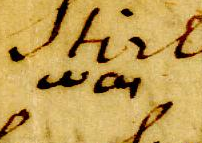was
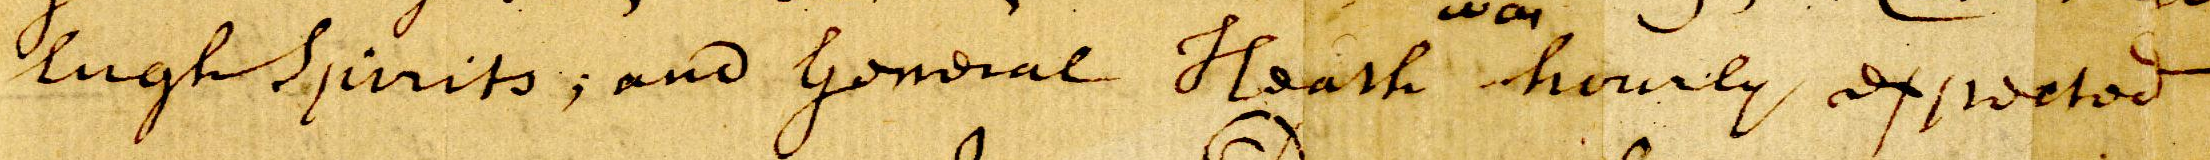lugh Spirits, and General Heath hourly expected
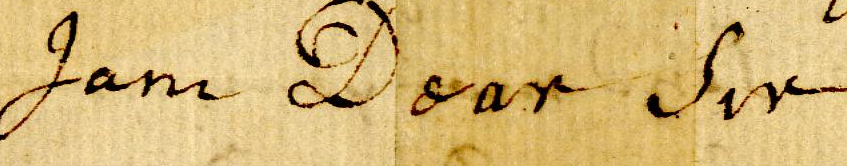I am Dear Sir
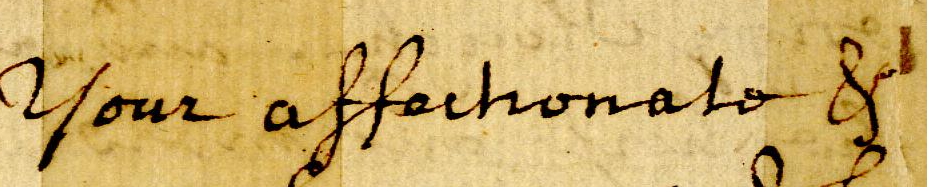Your affectionate &
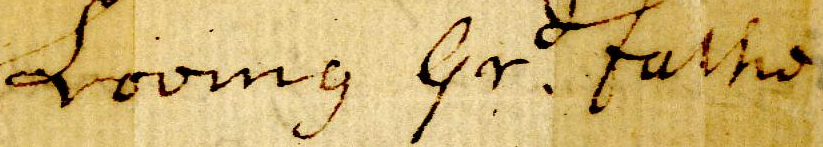Loving Gr^d. father
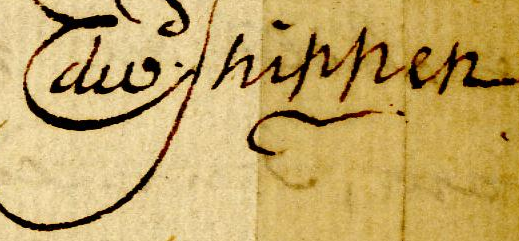Edw. Shippen
